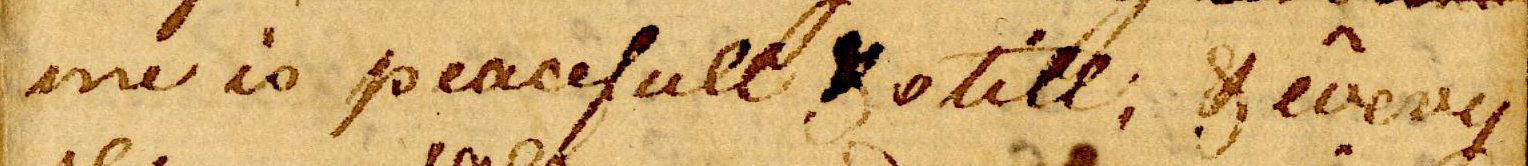me is peacefull & still, & every
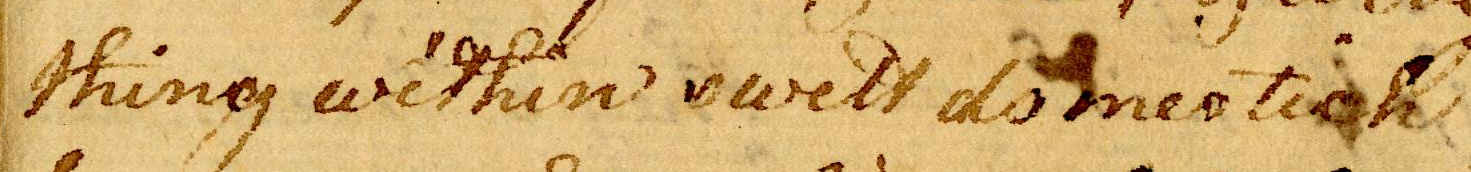thing within swelt domestick
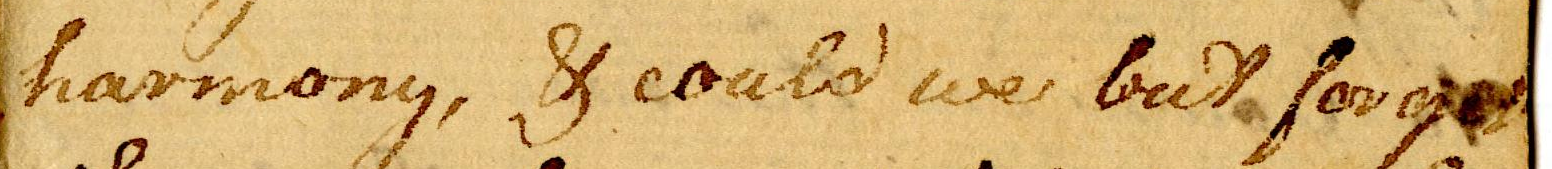harmony, & could we but forget
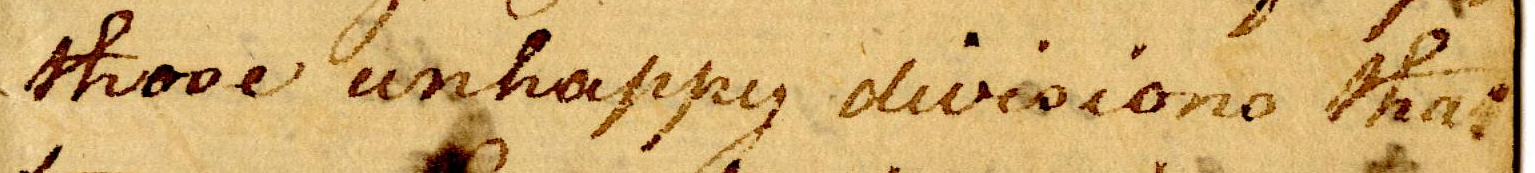those unhappy divisions that
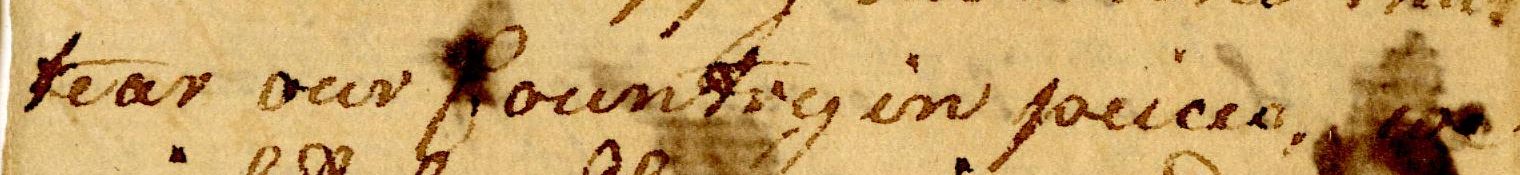tear our Country in peices, [__]
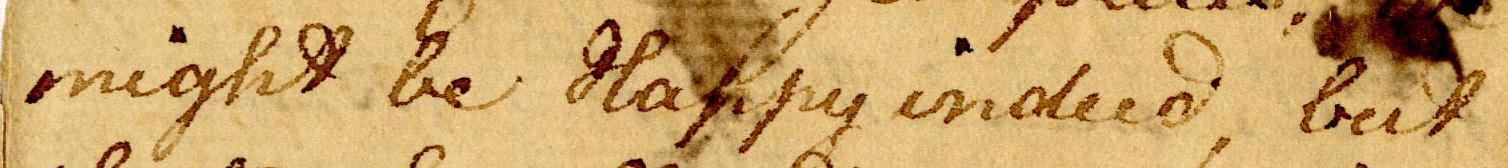might be Happy indeed, but
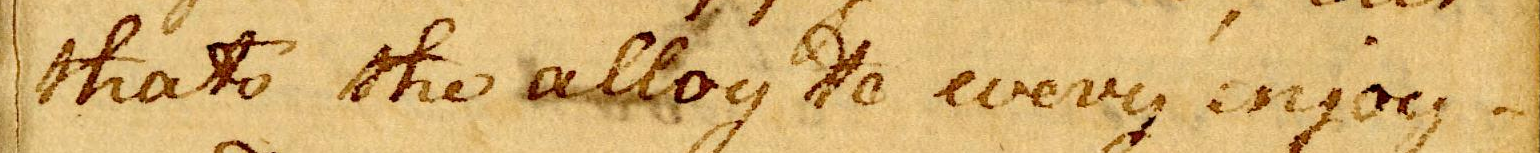thats the alloy to every enjoy-
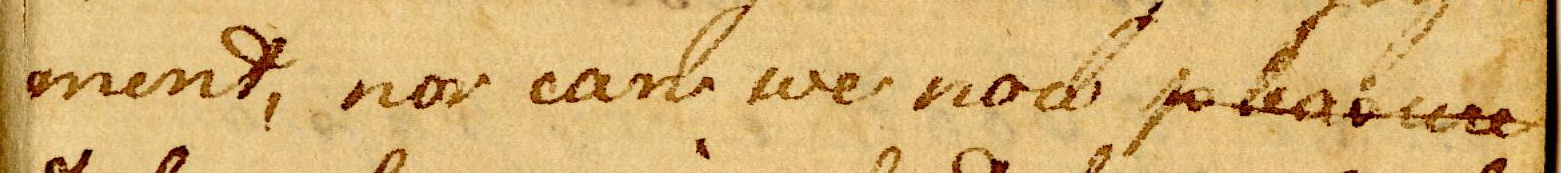ment, nor ear we now pleasure
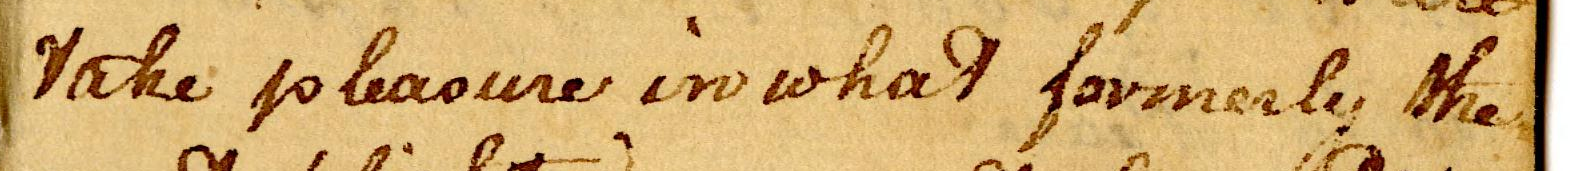take pleasure in what formerly the
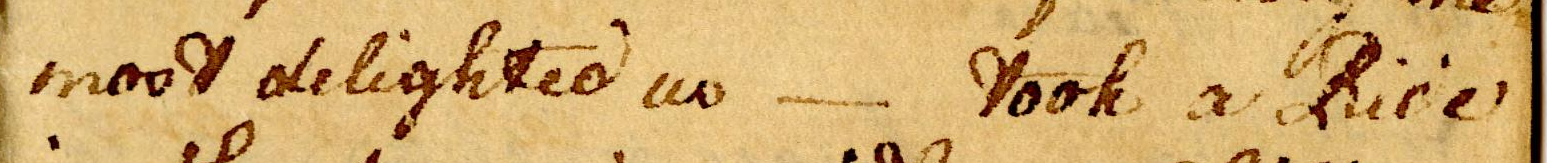most delighted us- took a Ride
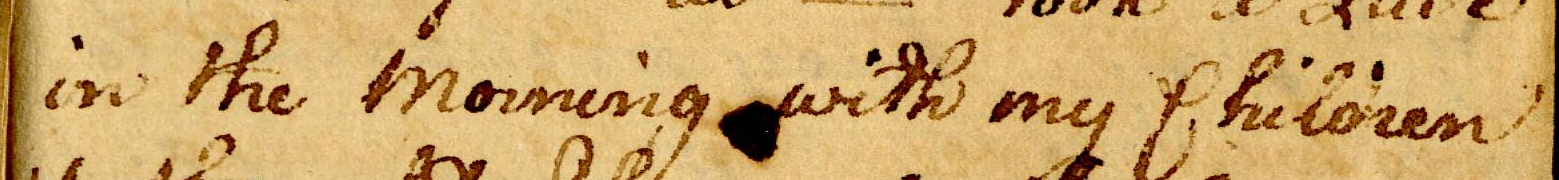in the Morning- with my Children
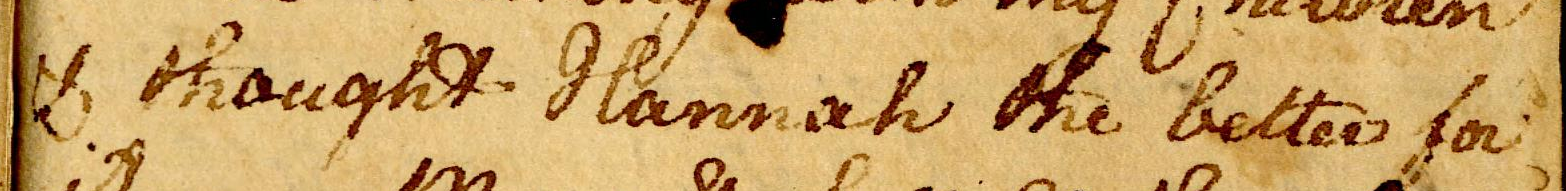& thought Hannah the better for
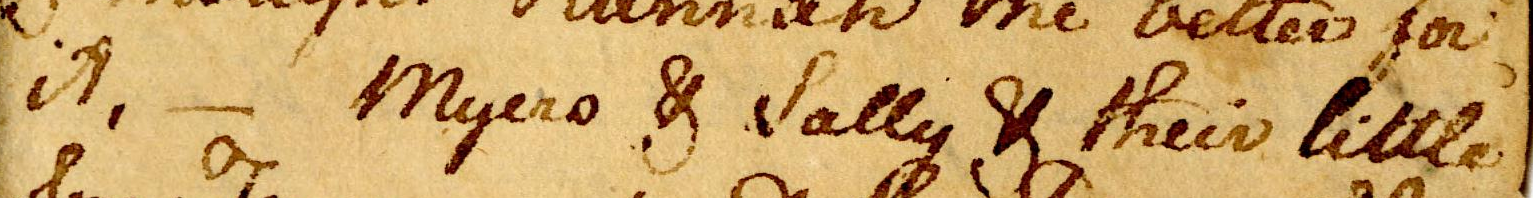it,- Myers & Sally & their little
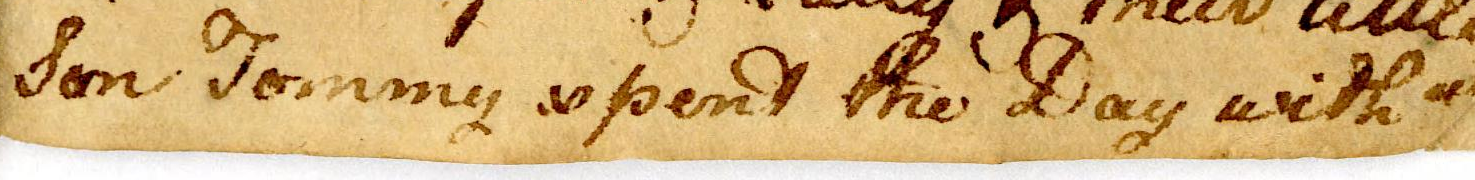Son Tommy spent the Day with [me]
